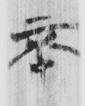不
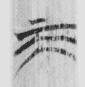天
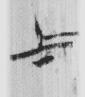上
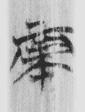帝
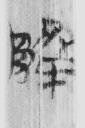降
